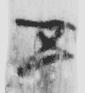五
